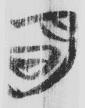明
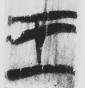王
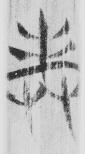奉
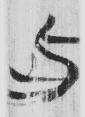此
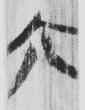六
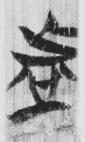者
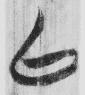㠯（以）
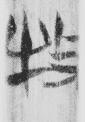牧
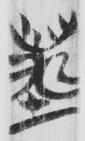{萬土}
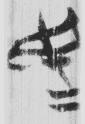民=
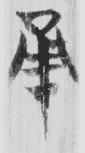甬
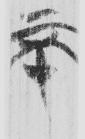不
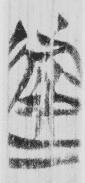{辶止㚔}
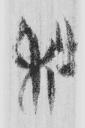{禾亡}
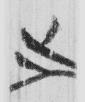之
